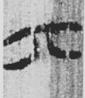亓（其）
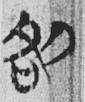咎
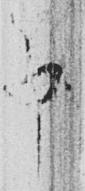中（仲）
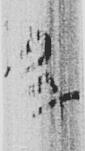弓
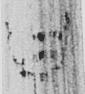曰
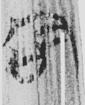含（今）
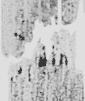之
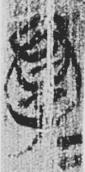君子
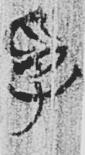孚
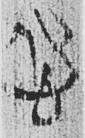○（過）
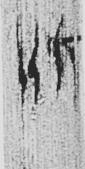析
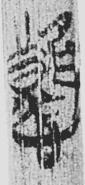戁（難）
